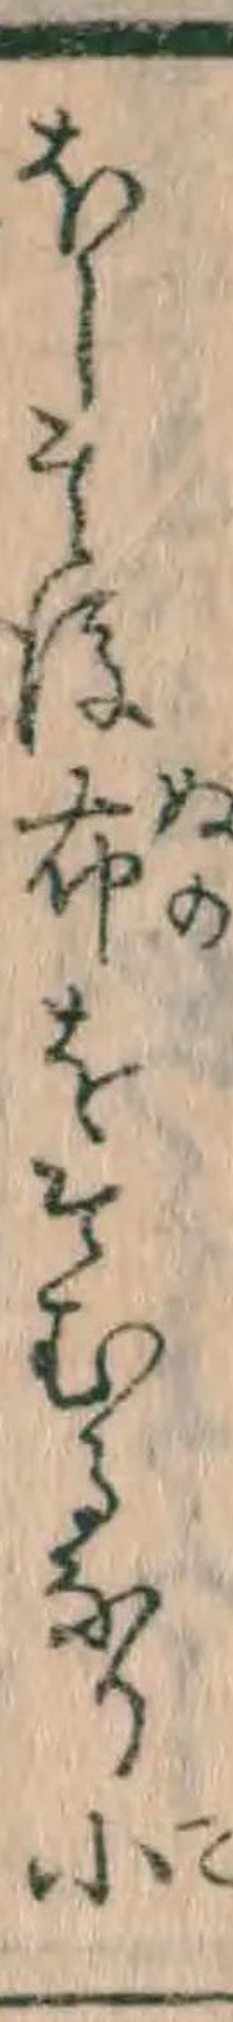ほし其後布をそむるなり小
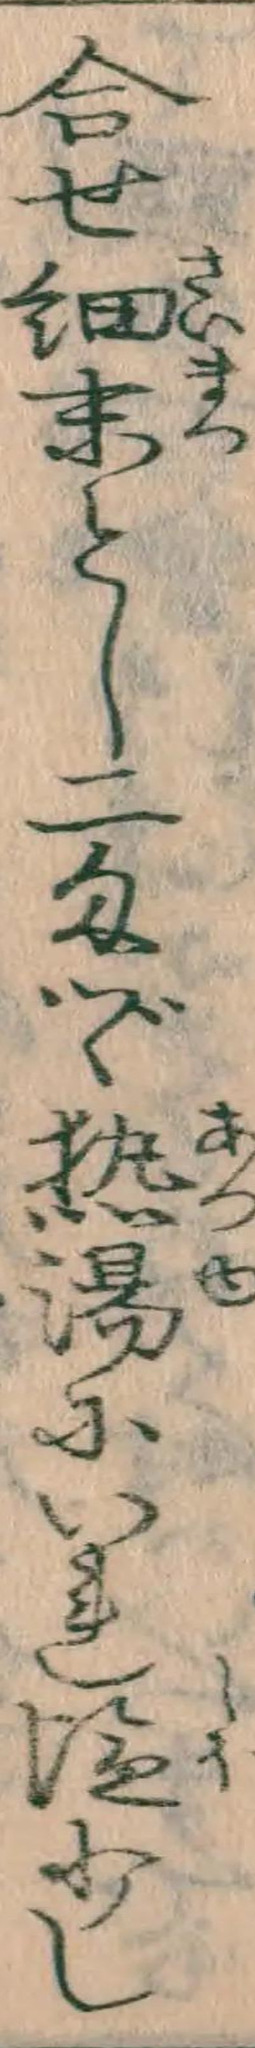合せ細末とし二匁ヅヽ熱湯にいれて塩少し
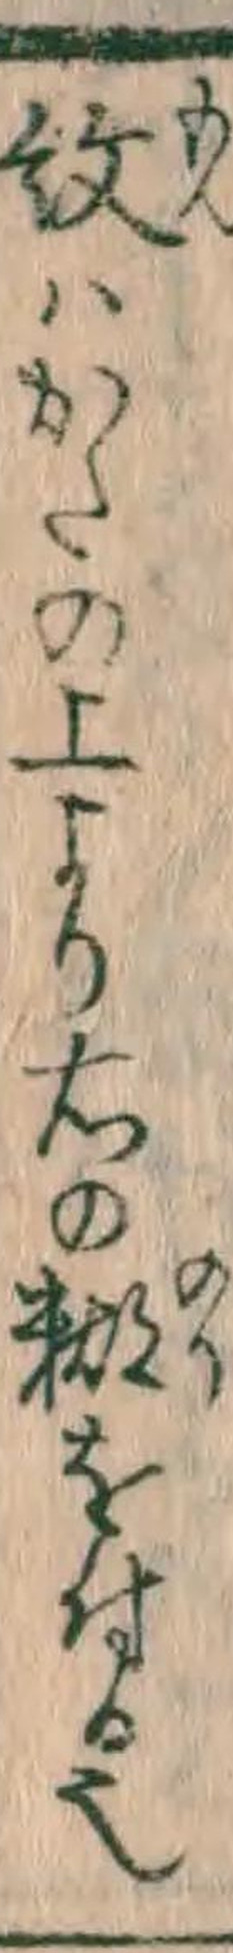紋はかたの上より右の糊を付る也
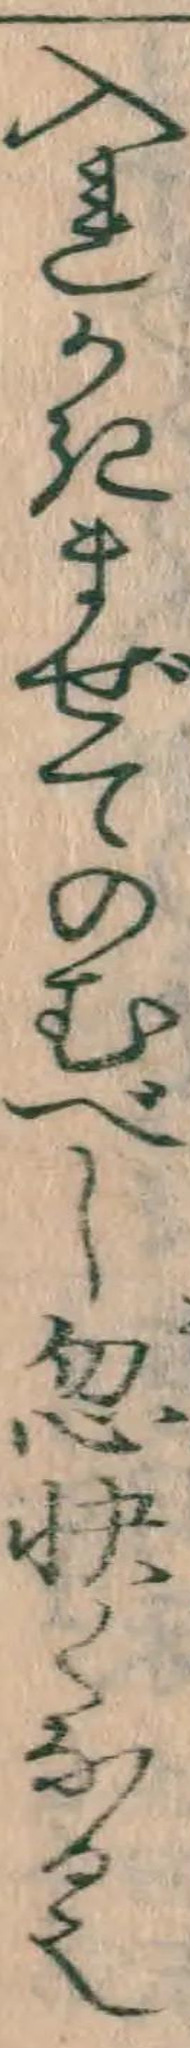入れかきまぜてのむべし忽快くなる也
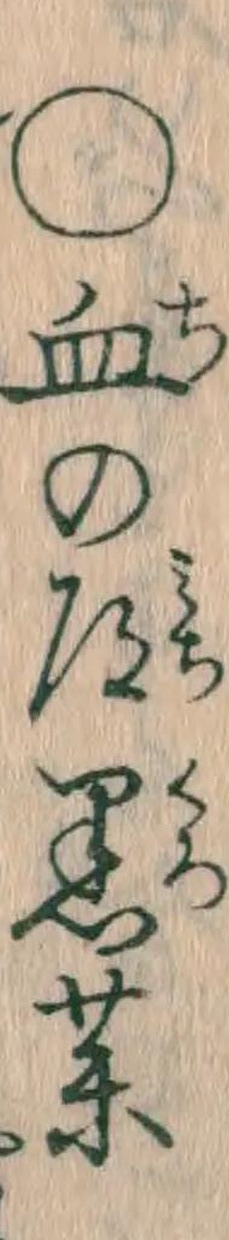○血の道黒薬
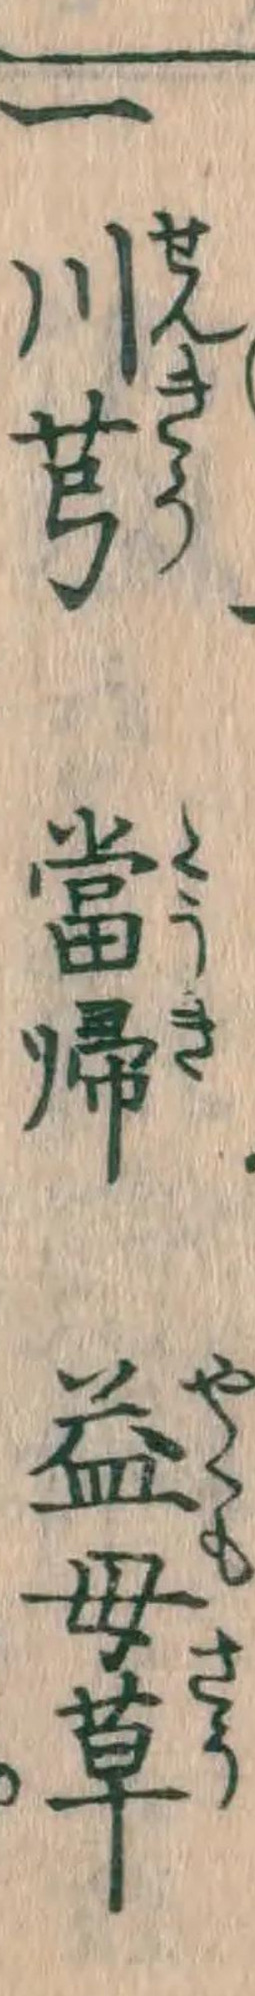一川芎当帰益母草
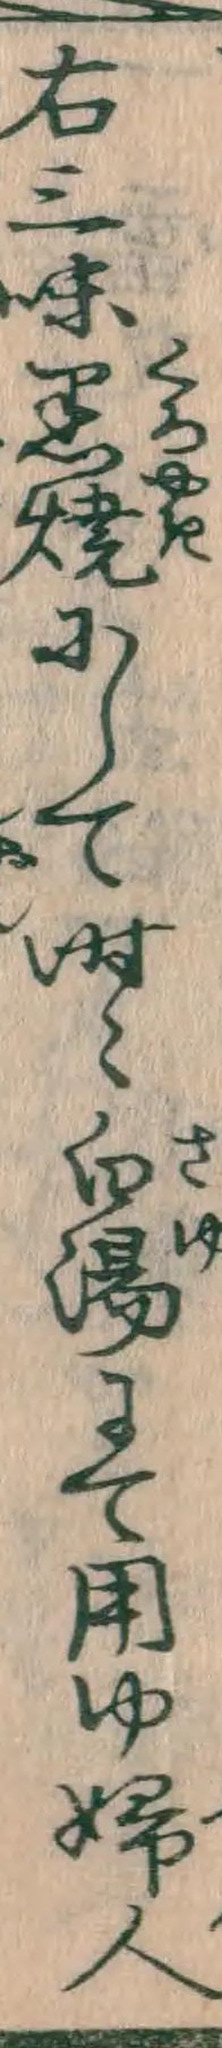右三味黒焼にして時々白湯にて用ゆ婦人
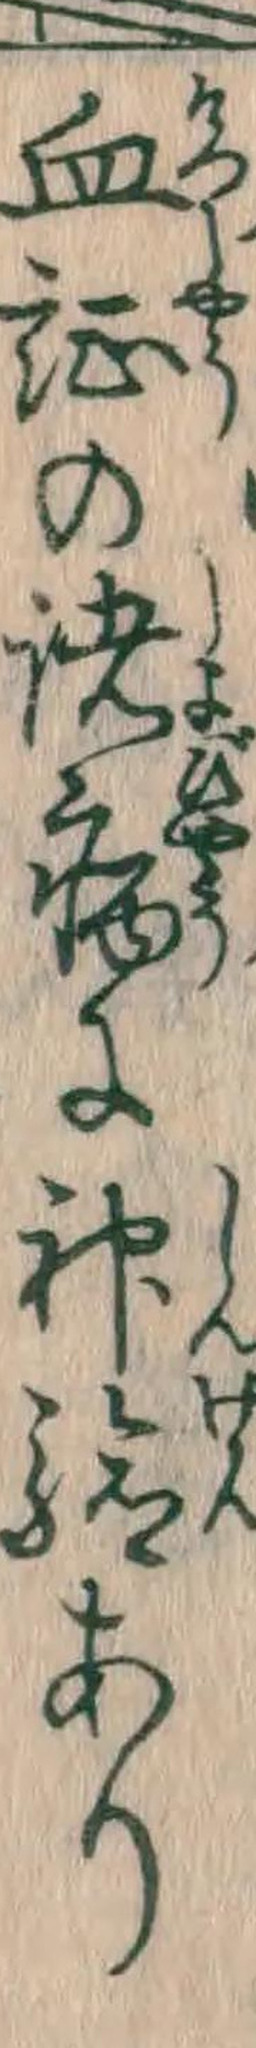血証の諸病に神験あり
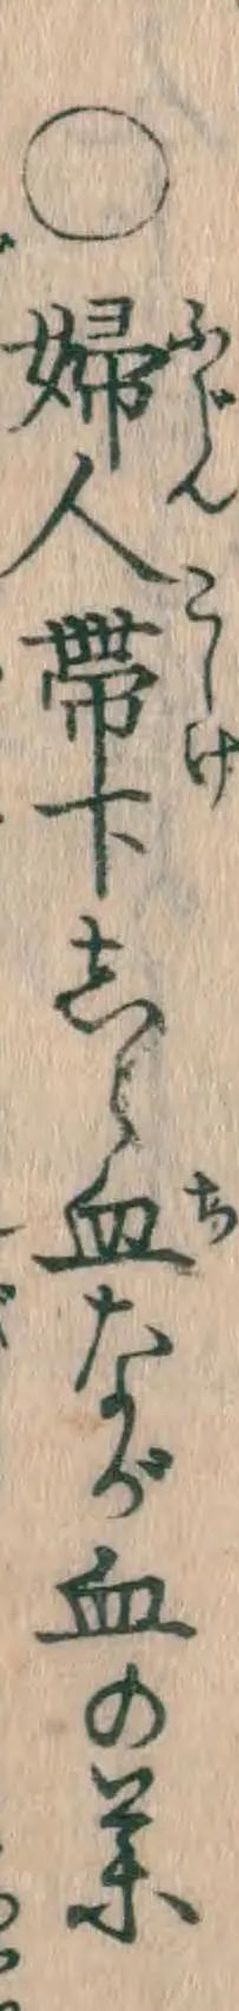○婦人帯下しら血なが血の薬
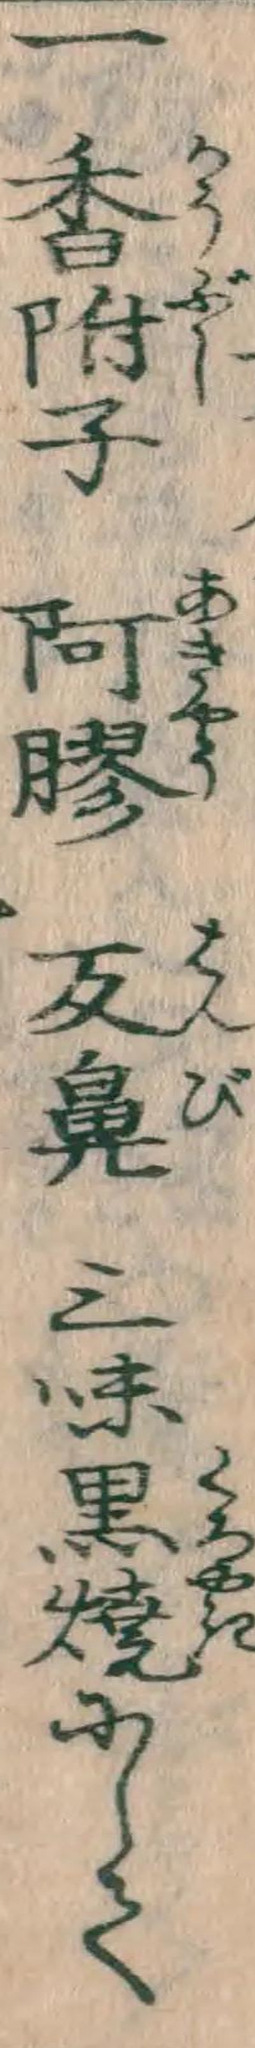一香附子阿膠反鼻三味黒焼にして
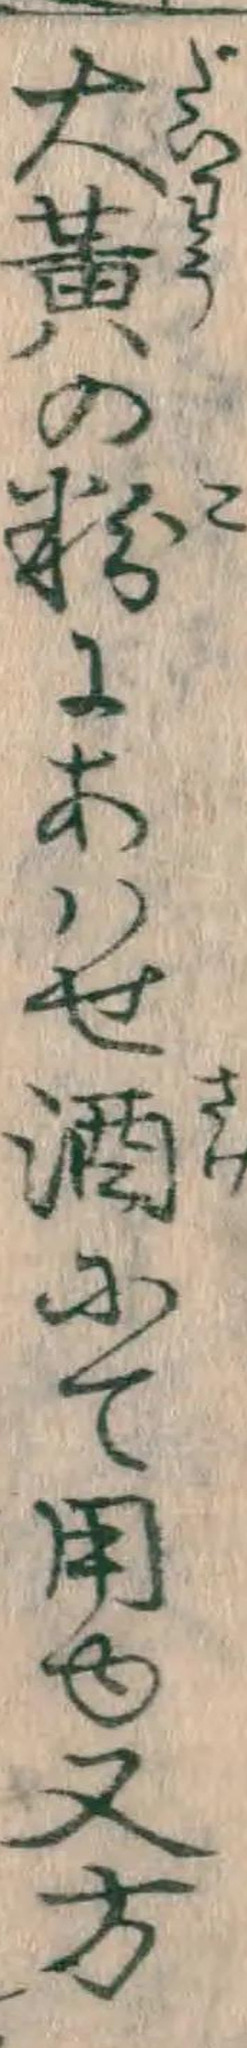大黄の粉にあはせ酒にて用ゆ又方
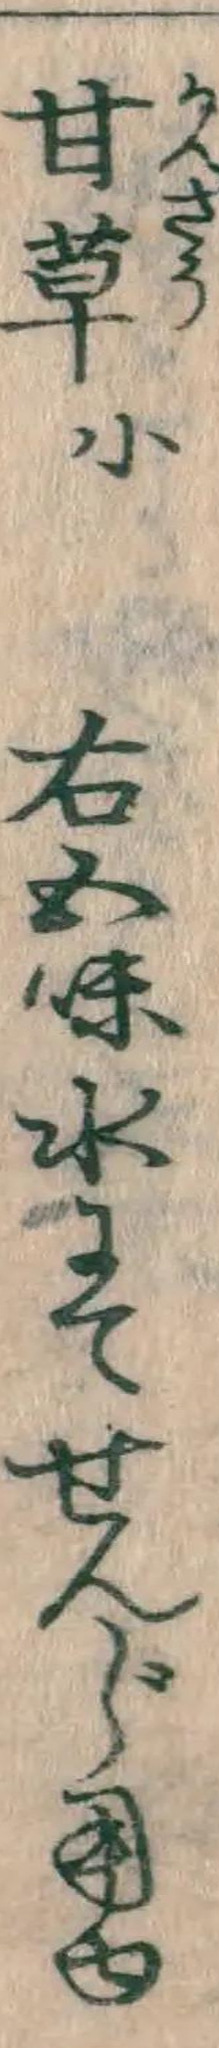甘草小右五味水にてせんじ用ゆ
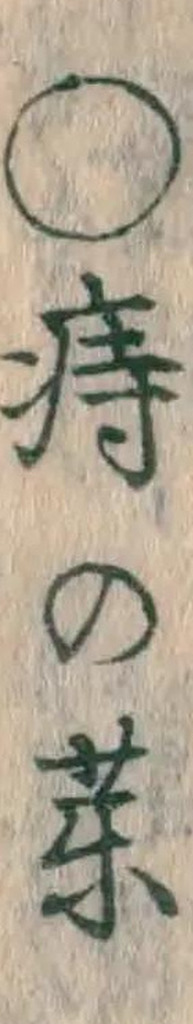○痔の薬
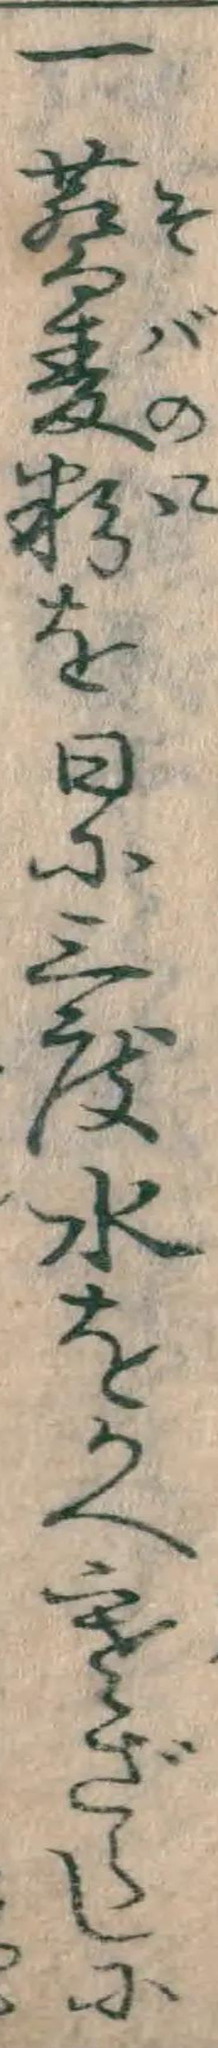一蕎麦粉を日に三度水をかへ寒ざらしに
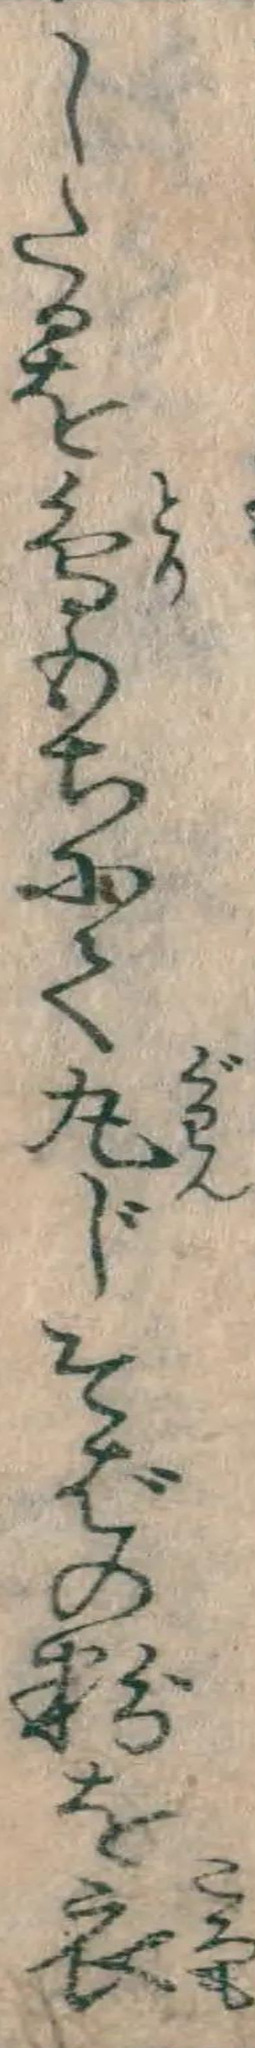したるを鳥もちにて丸じそばの粉を衣
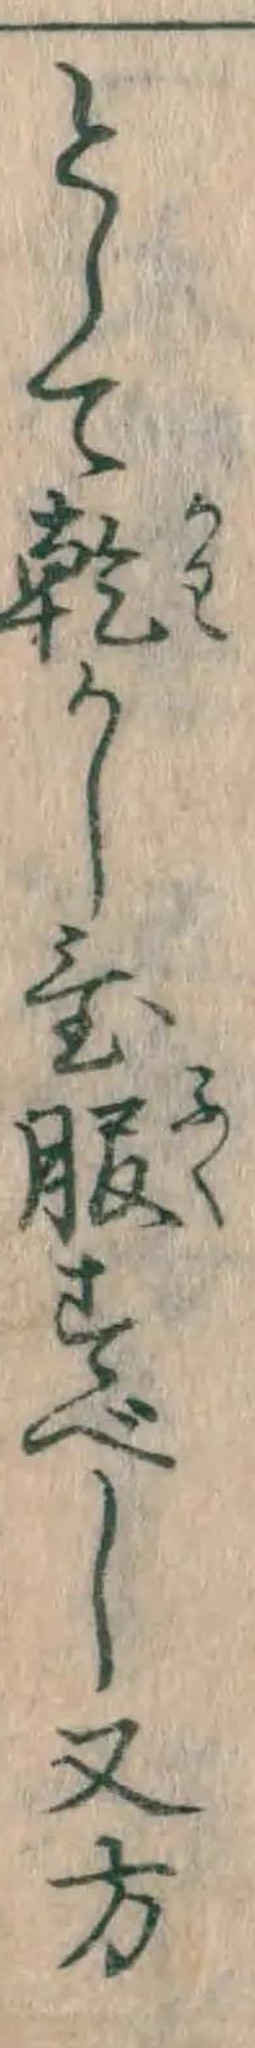として乾かし置服すべし又方
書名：広益秘事大全 3巻. [3]
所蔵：国立国会図書館 National Diet Library, JAPAN
